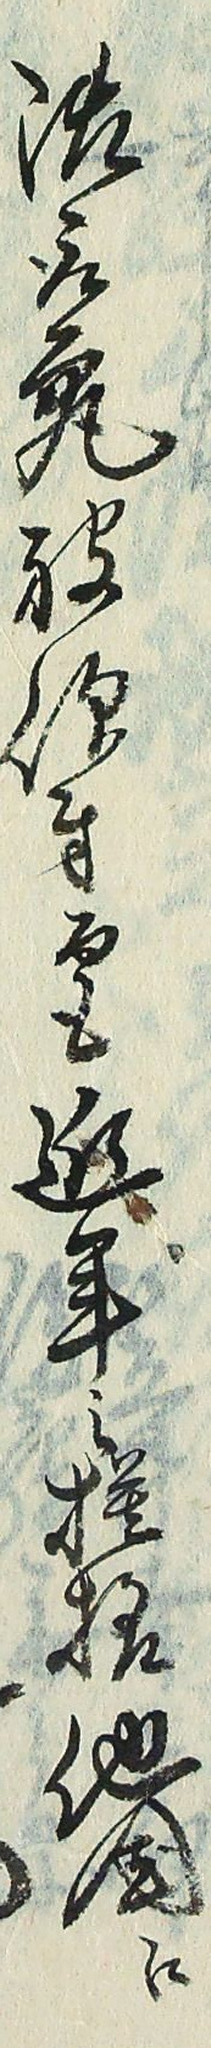御取究被仰付而も近年之模様他国江
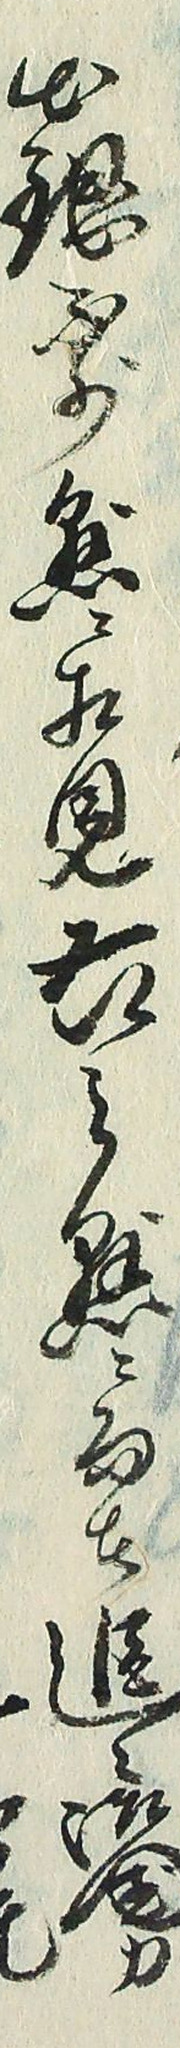出銀不少懸ニ相見右之懸ニ而者追々御国力
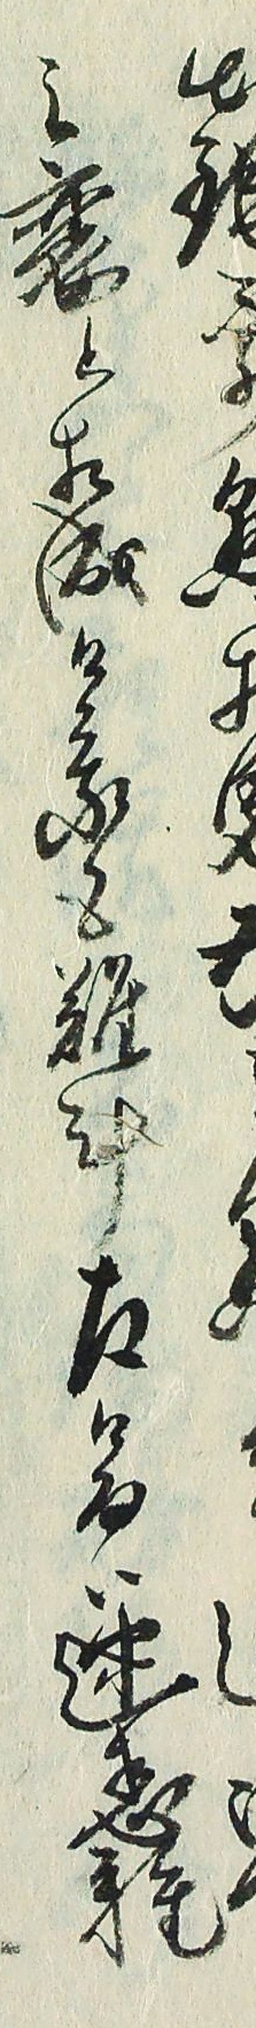之衰と相成候義も難計左候而ハ迷惑難
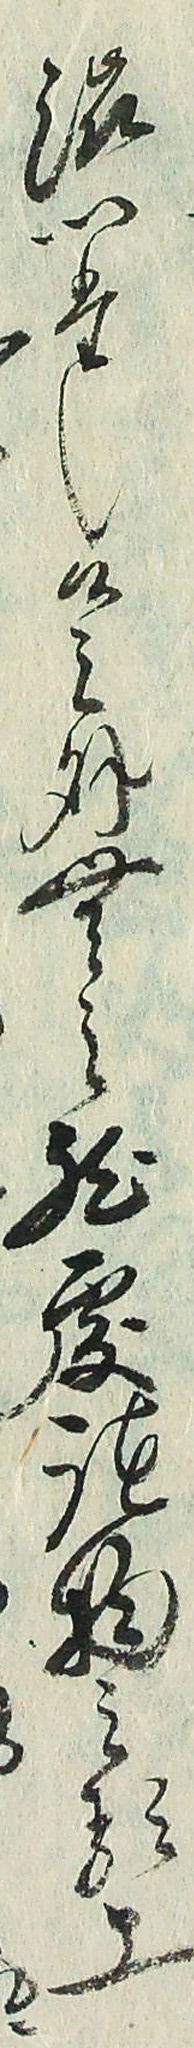渋いたし候之外無之然處諸物之類上
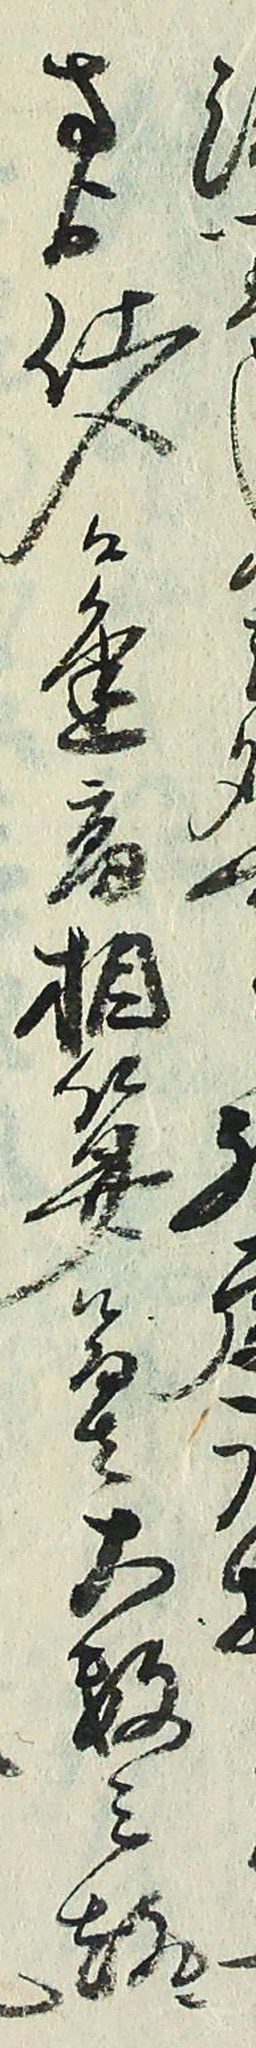方ゟ仕入候金高相算候而者大数之趣ニ
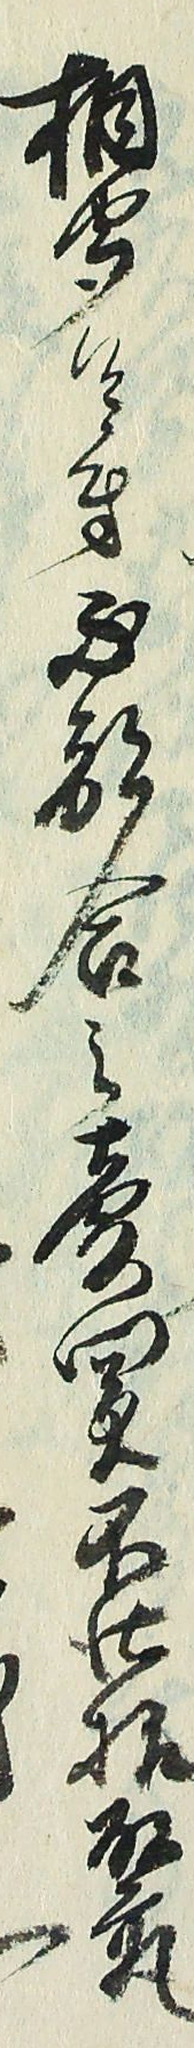相聞候ニ付不都合之賣買不仕様取究
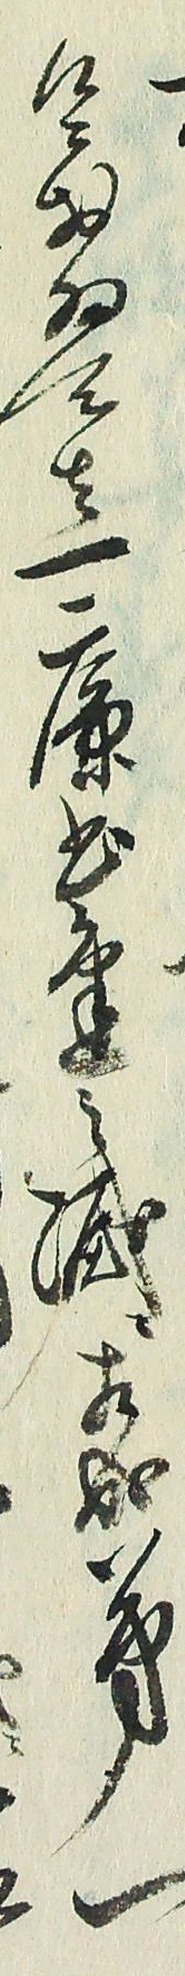候ニおゐて者一廉出金之減ニ相成第一
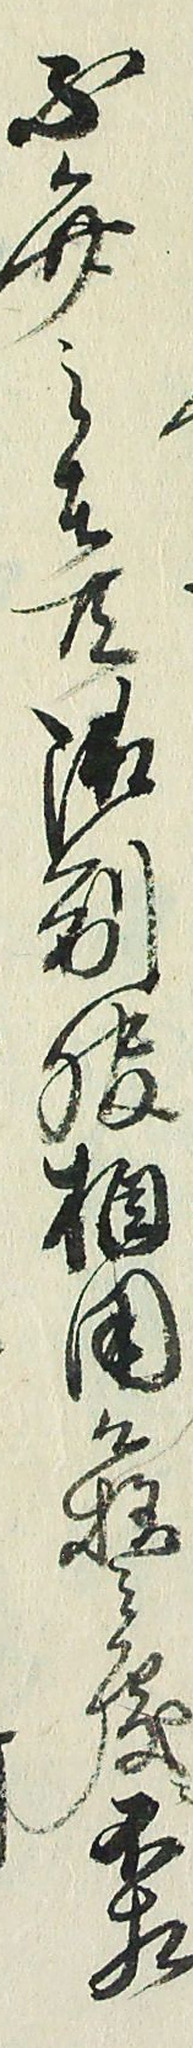不弁之者共御制服相用候様之處ニ不相
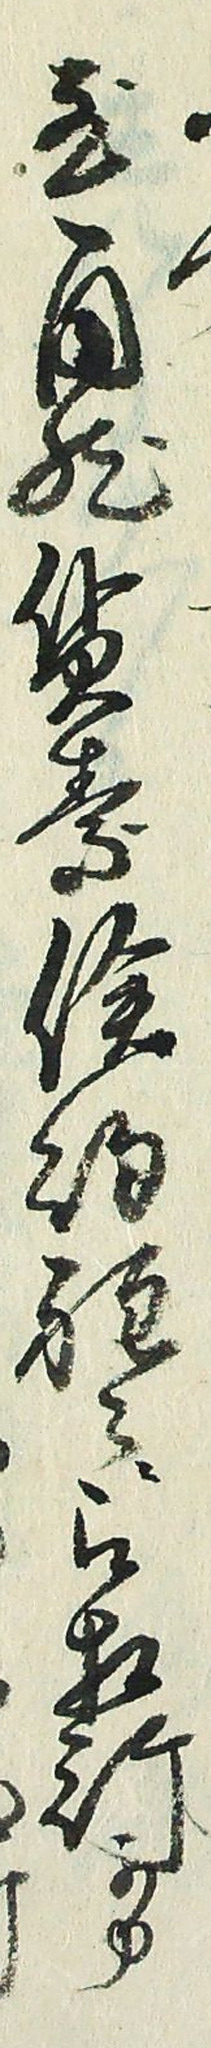至自然質素倹約程々ニ被相行可申
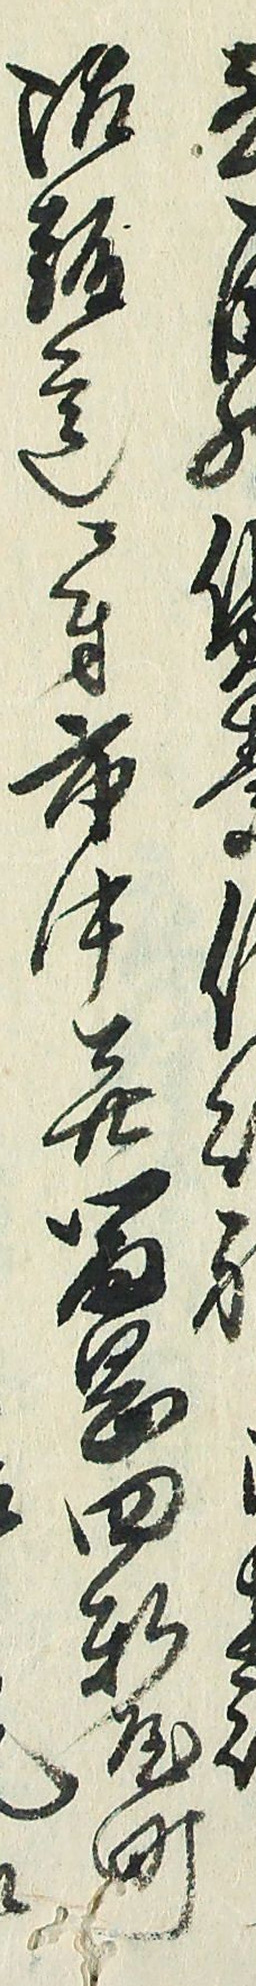御趣意ニ付市中幷冨岡四軒屋町
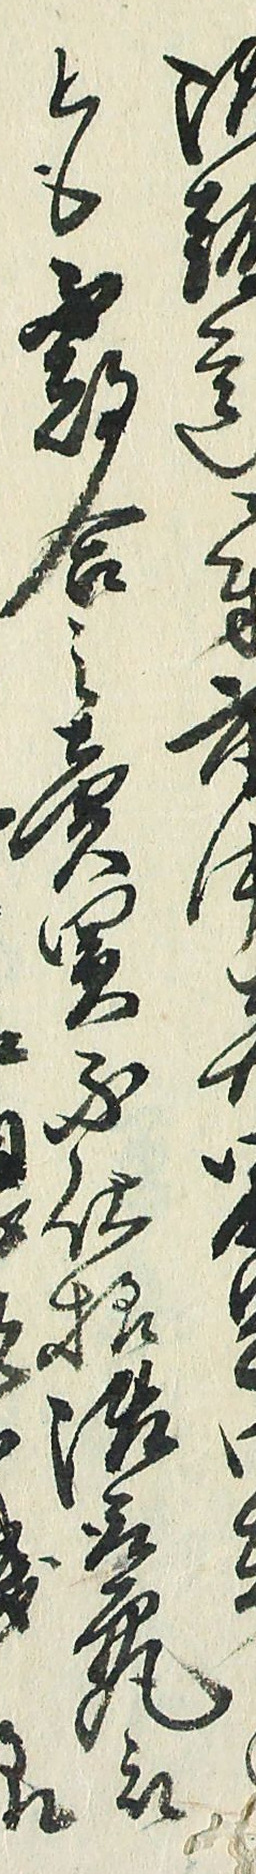とも不都合之賣買不仕様御取究被
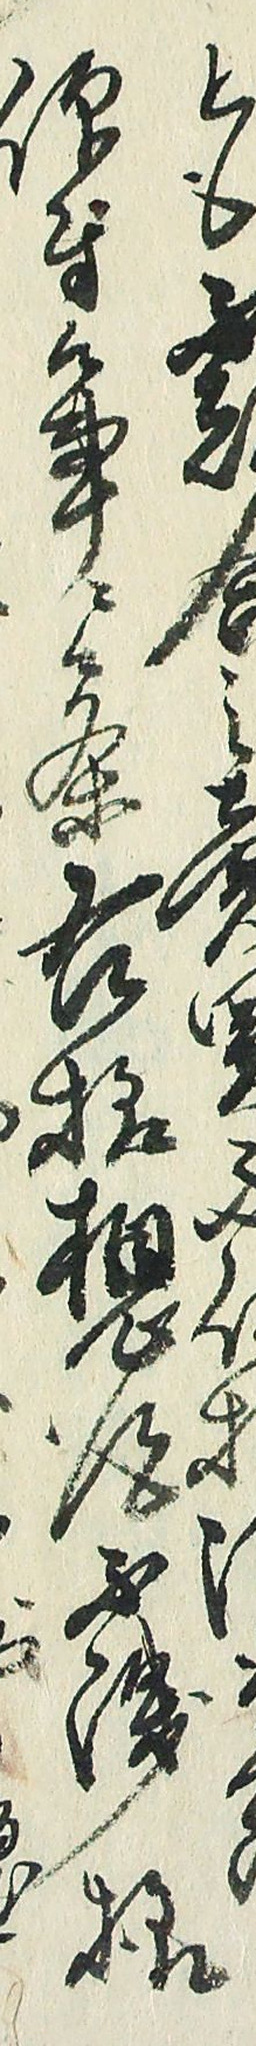仰付候事ニ候条右様相心得不洩様
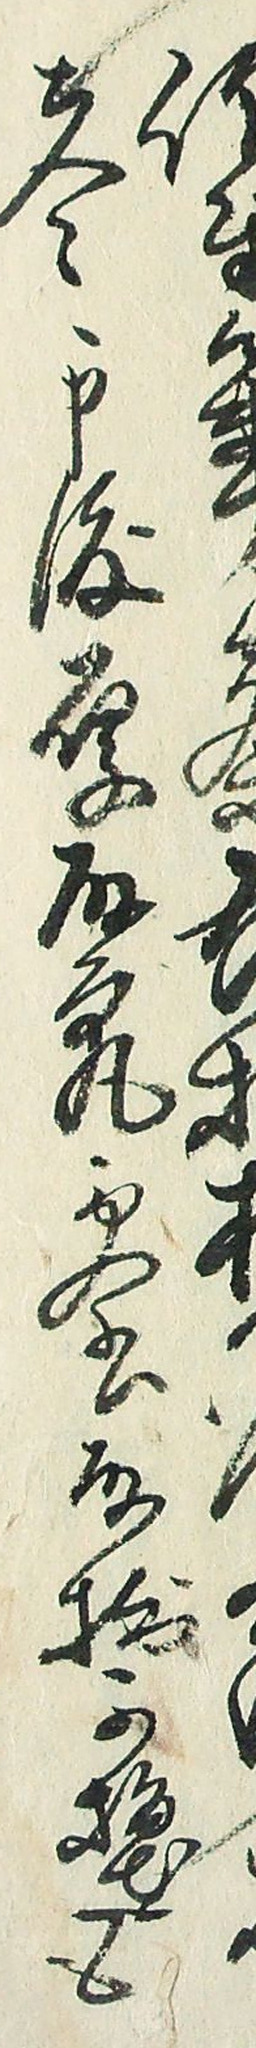夫々へ申渡厚取究受書取揃可指出候以上

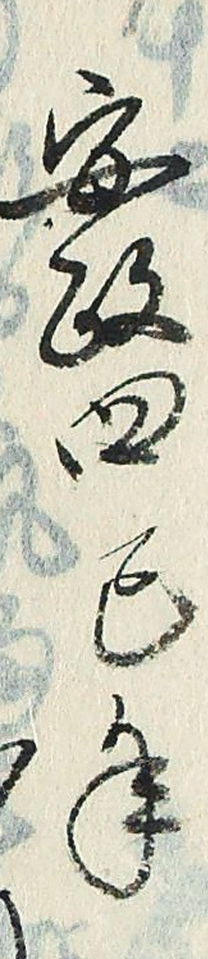安政四巳年
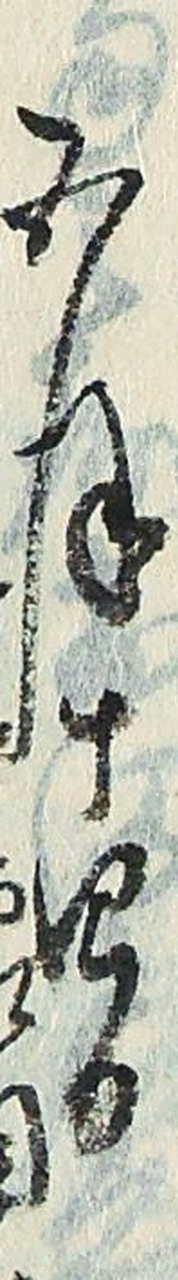五月十四日
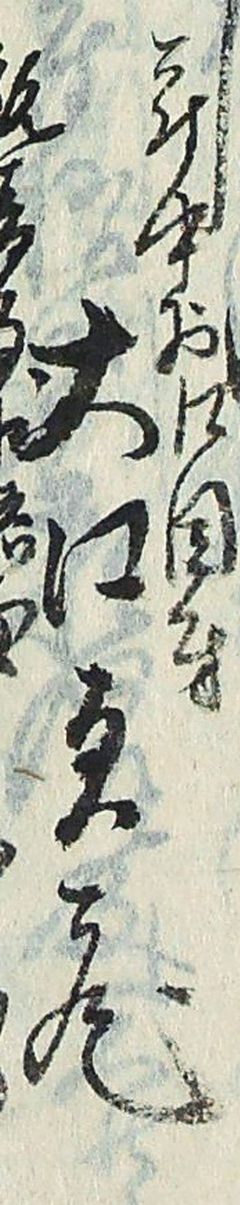大江真蔵
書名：諸御趣意書并御下知向之写
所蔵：鳴門教育大学 Naruto University of Education
